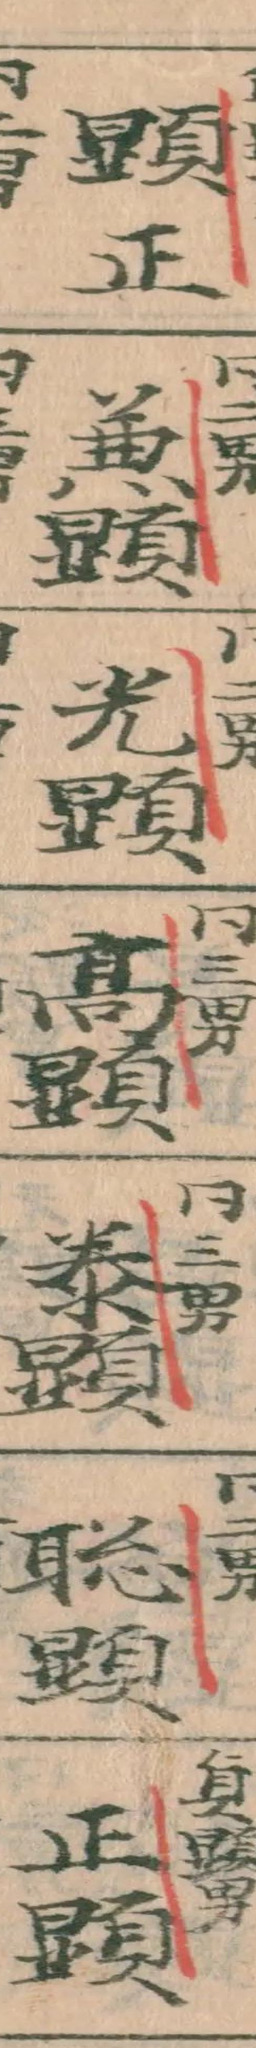顕正兼顕光顕髙顕泰顕聡顕正顕
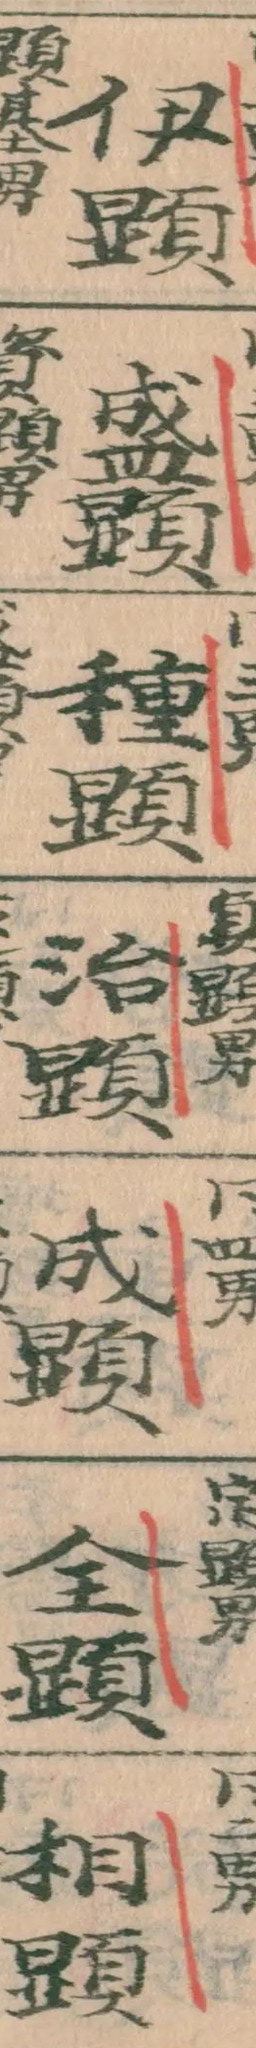伊顕盛顕種顕治顕成顕全顕相顕
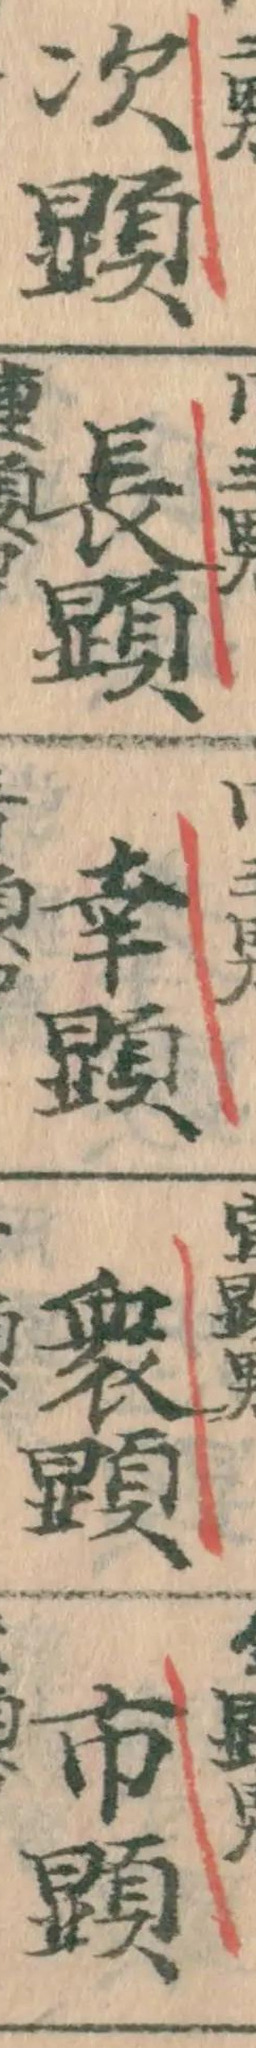次顕長顕幸顕衆顕市顕
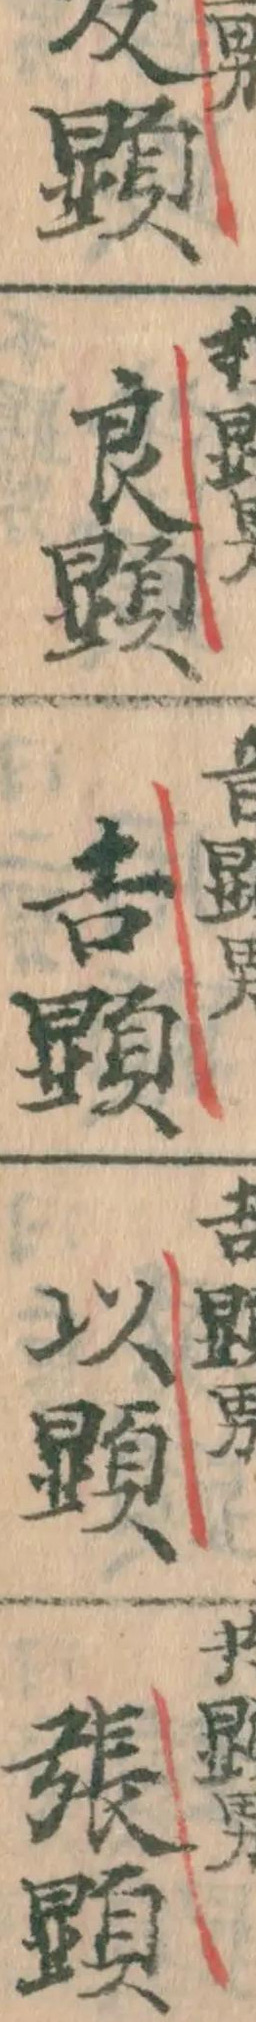友顕良顕𠮷顕以顕張顕

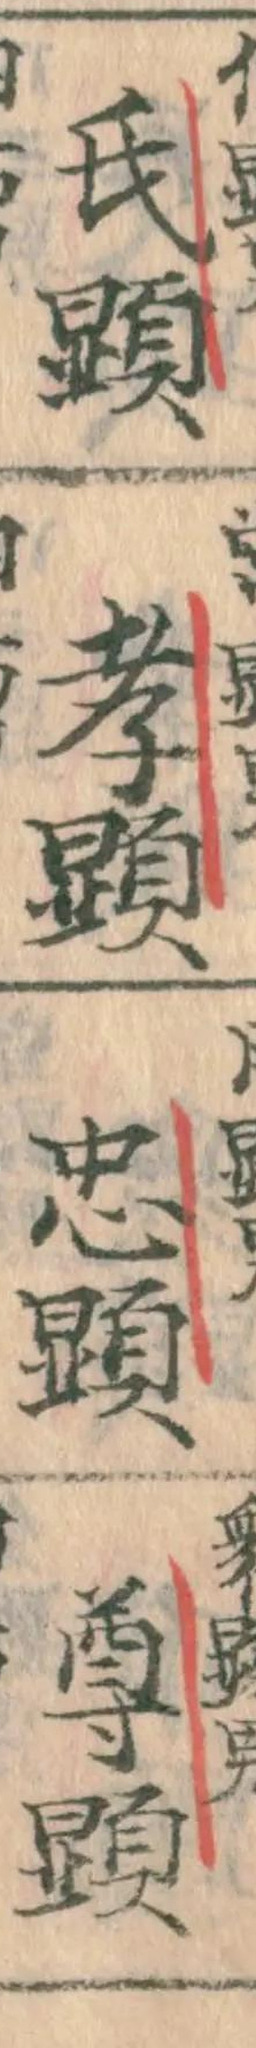氏顕孝顕忠顕尊顕
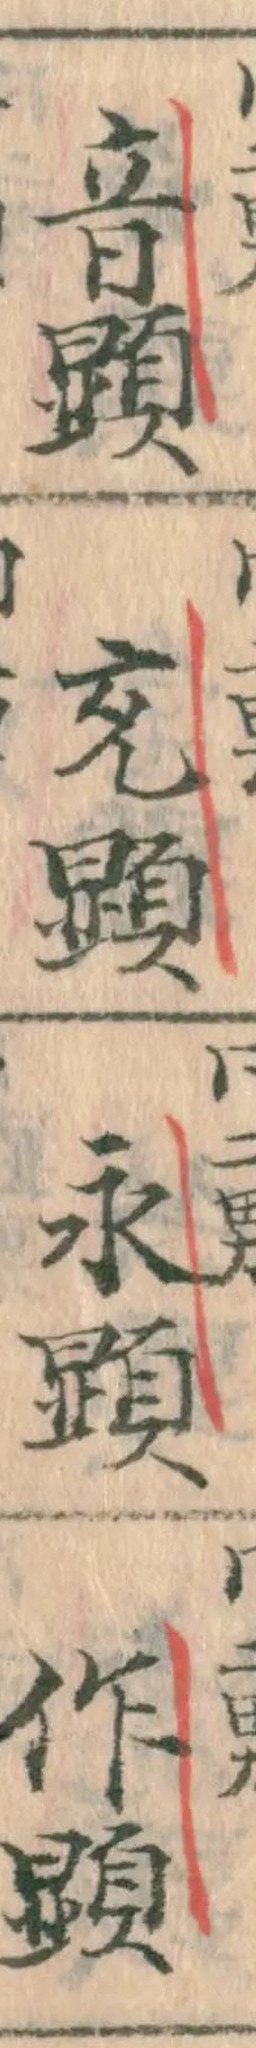音顕充顕永顕作顕
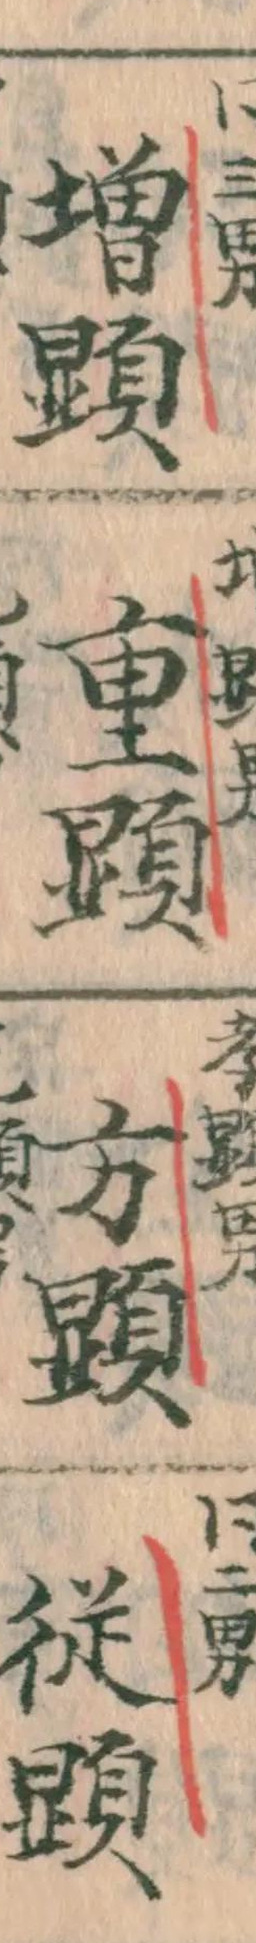増顕重顕方顕従顕
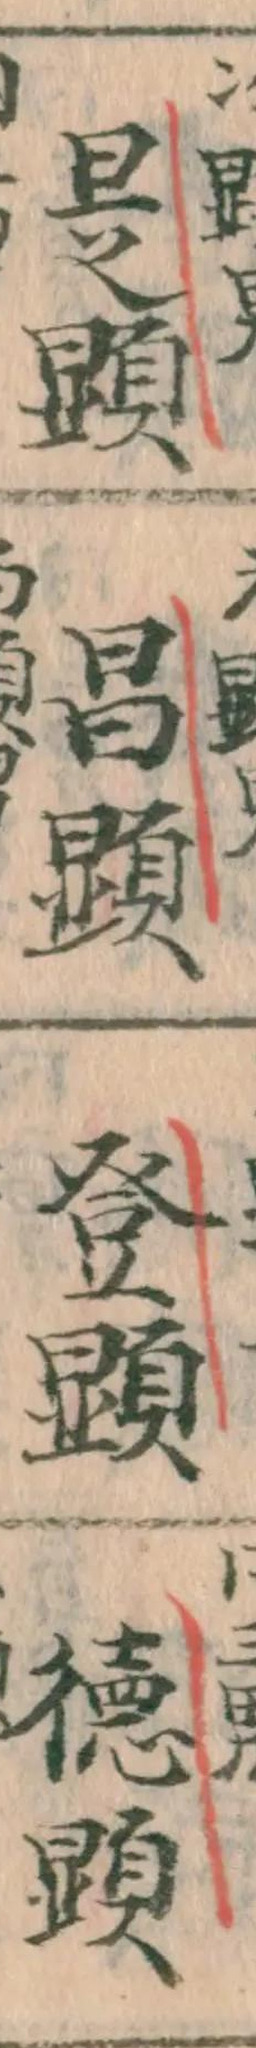是顕昌顕登顕徳顕
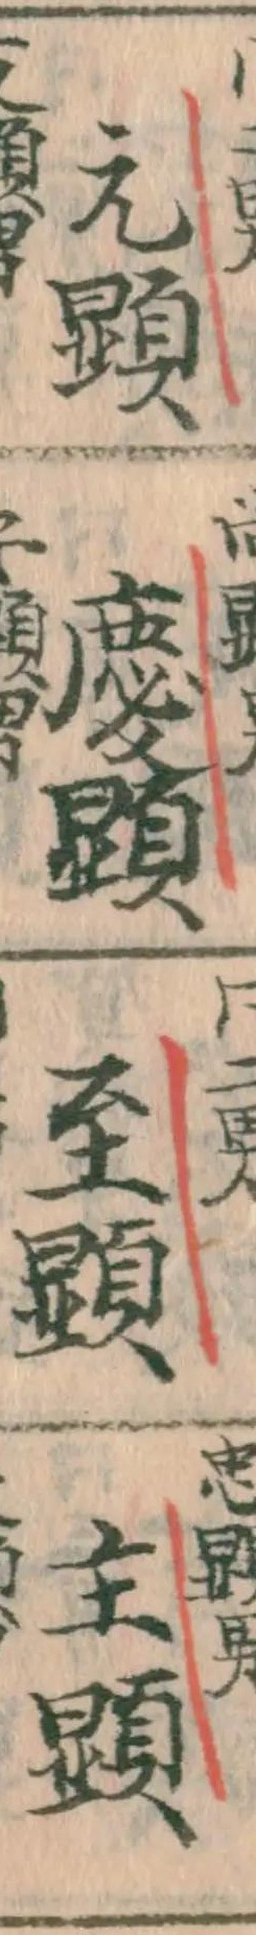元顕慶顕至顕主顕
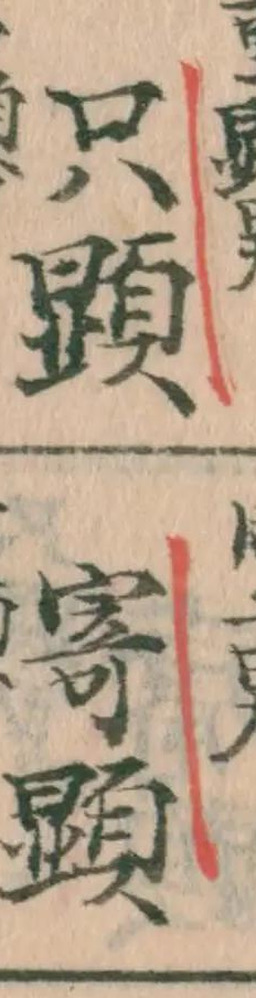只顕寄顕

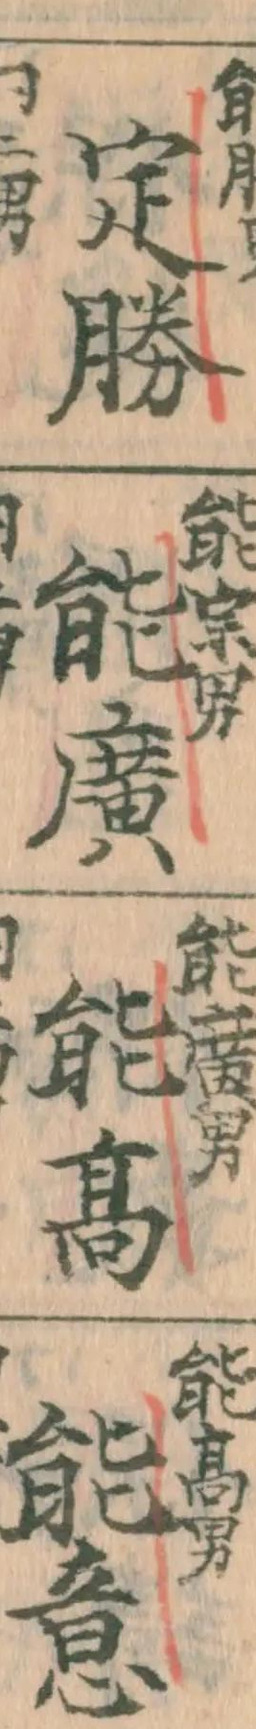定勝能広能髙能意
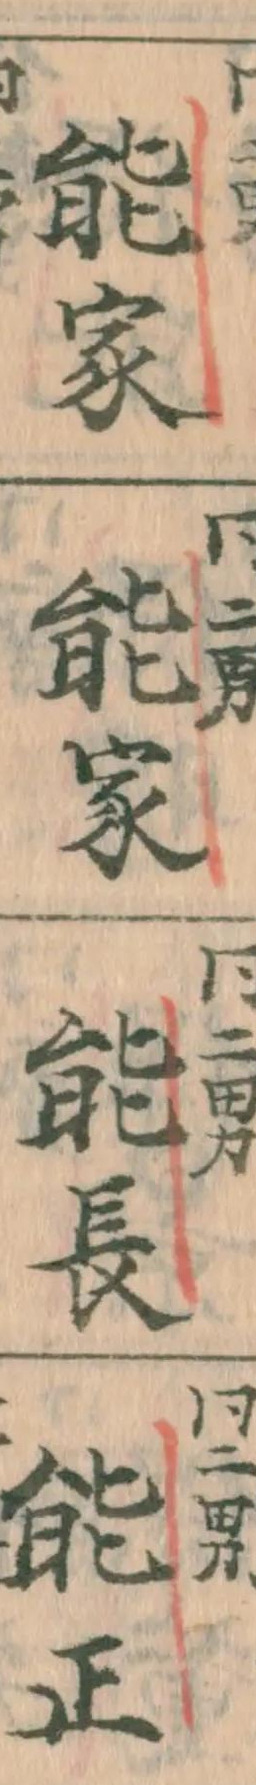能家能家能長能正
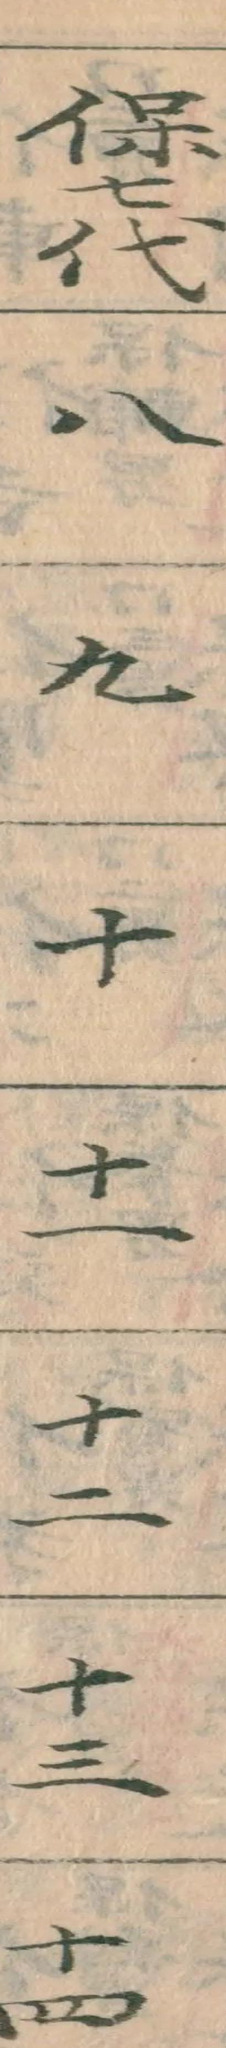保七代八九十十一十二十三十四
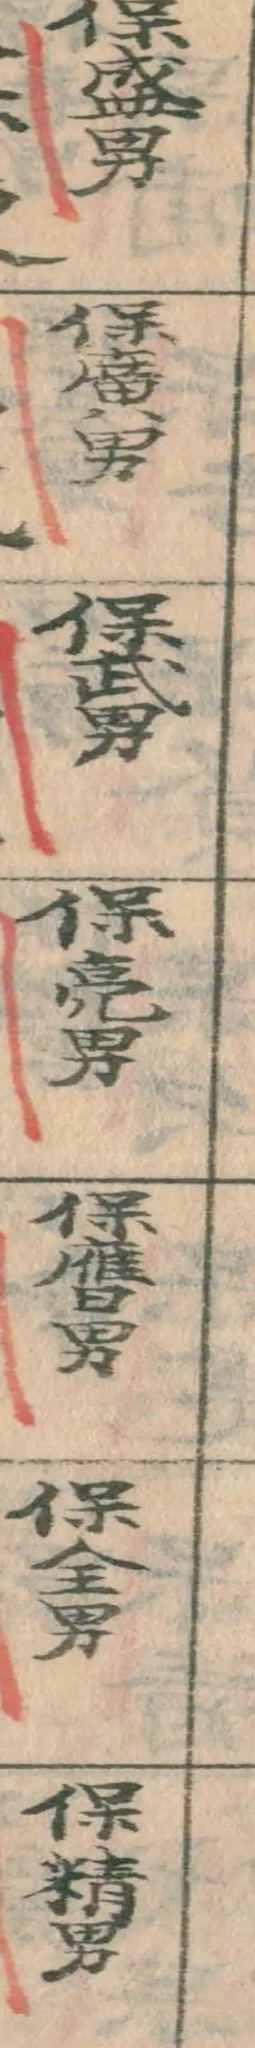保盛男保広男保武男保亮男保男保全男保精男
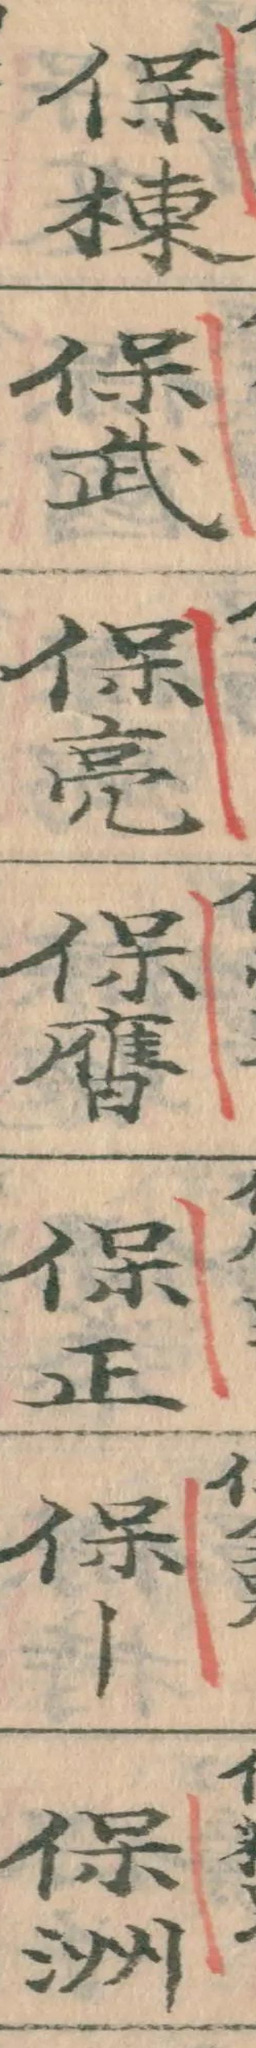保棟保武保亮保保正保ー保洲
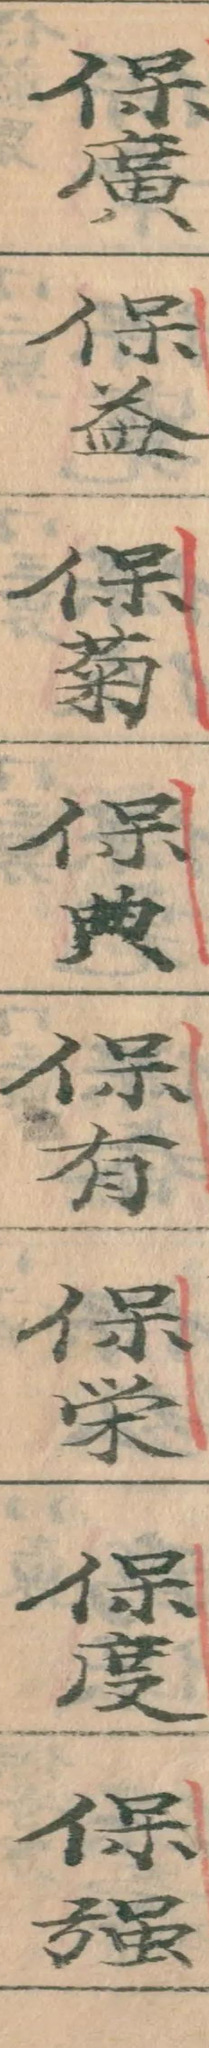保広保益保菊保典保有保栄保度保強
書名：賀茂社記録. 第24冊
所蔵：国立国会図書館 National Diet Library, JAPAN
